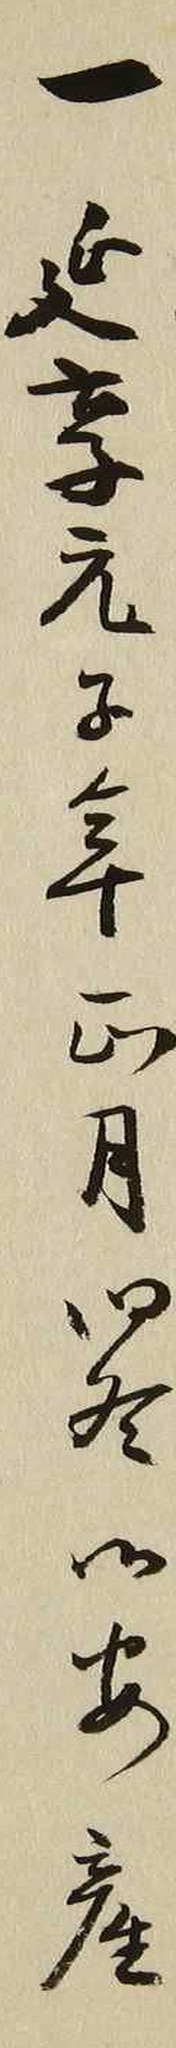一延享元子年正月旧冬御安産
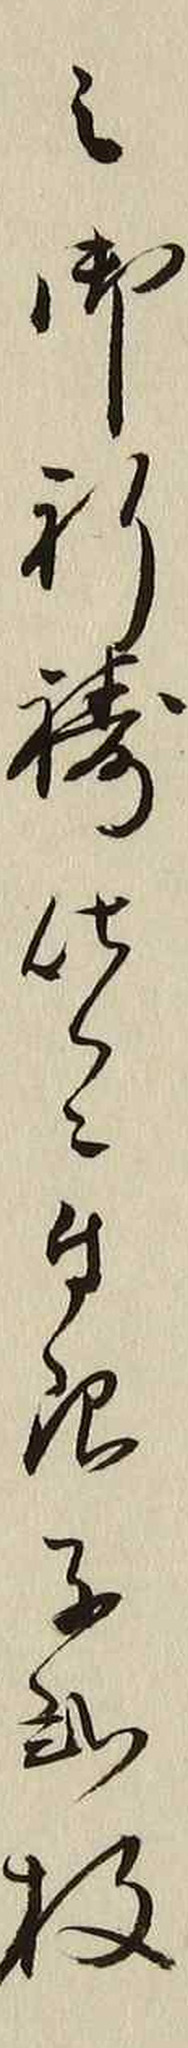之御祈祷仕候ニ付銀子弐枚
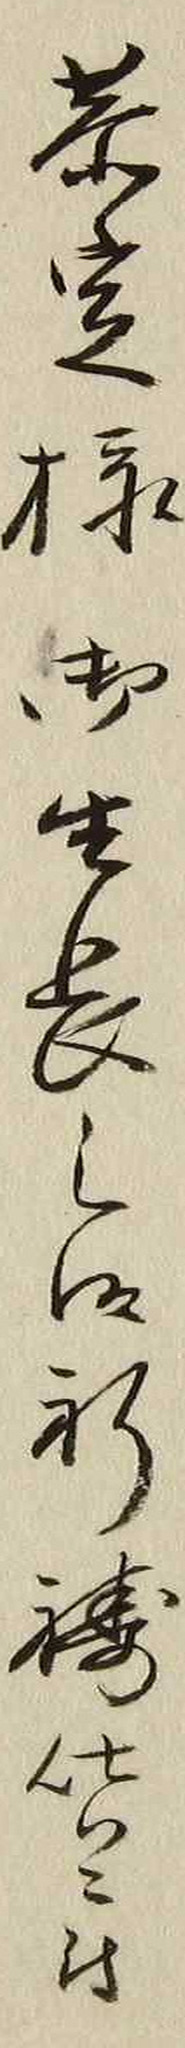恭定様御生長之御祈祷仕候ニ付
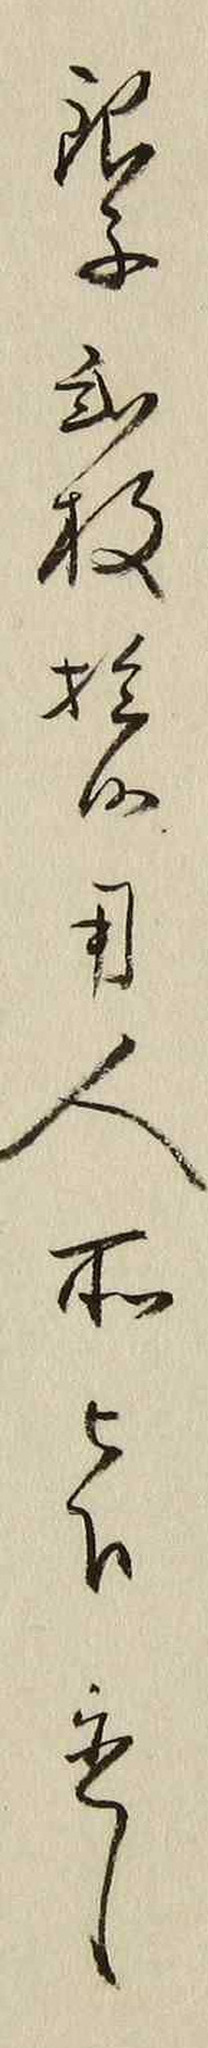銀子弐枚於御用人所被下置候
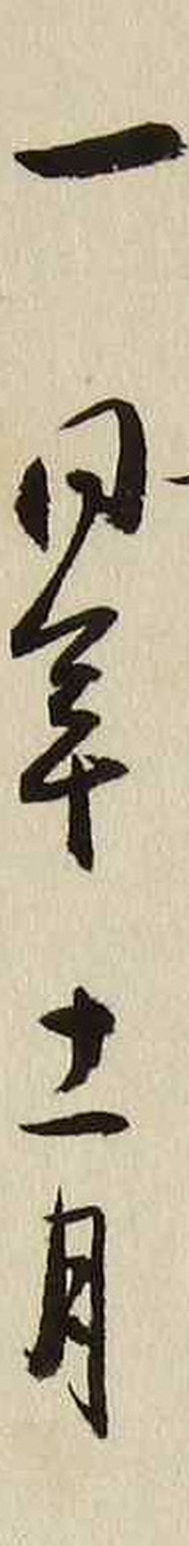一同年十一月
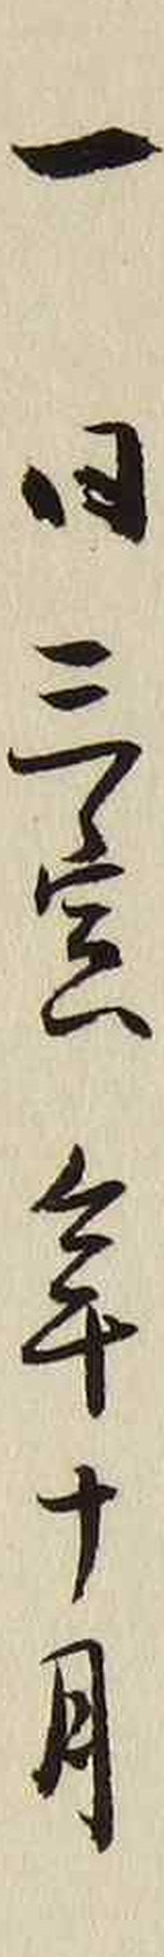一同三寅年十月
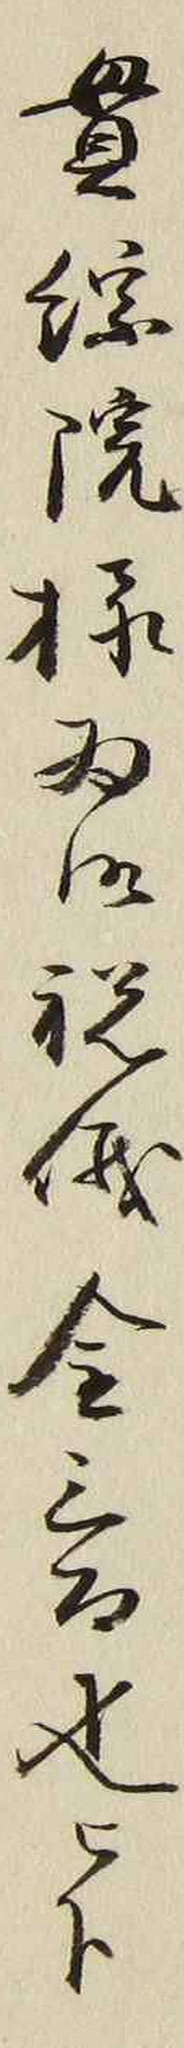貫綜院様為御祝儀金三百疋被下
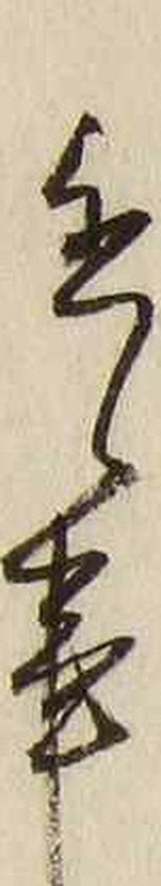置候事
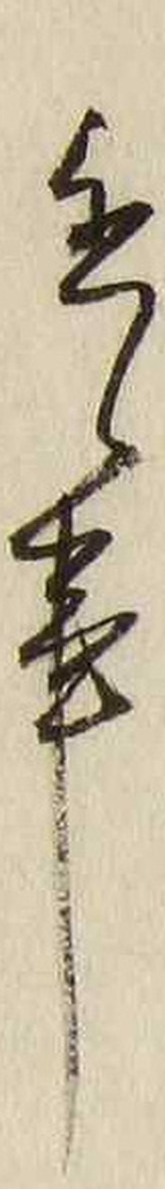置候事

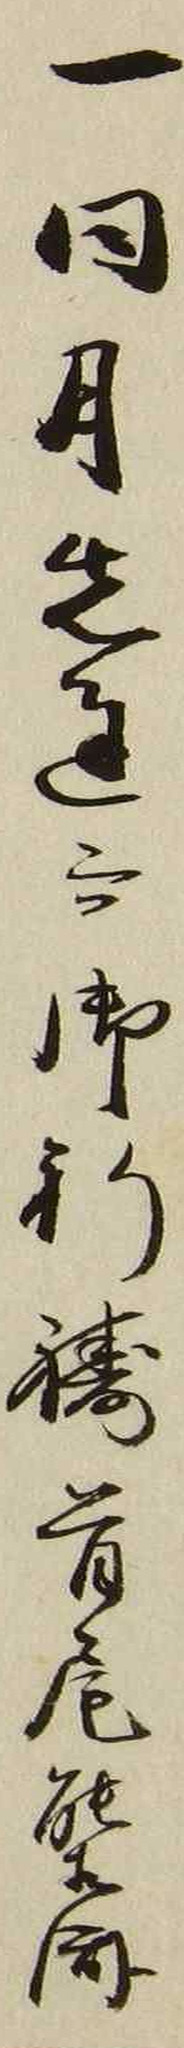一同月先達而御祈祷首尾能済
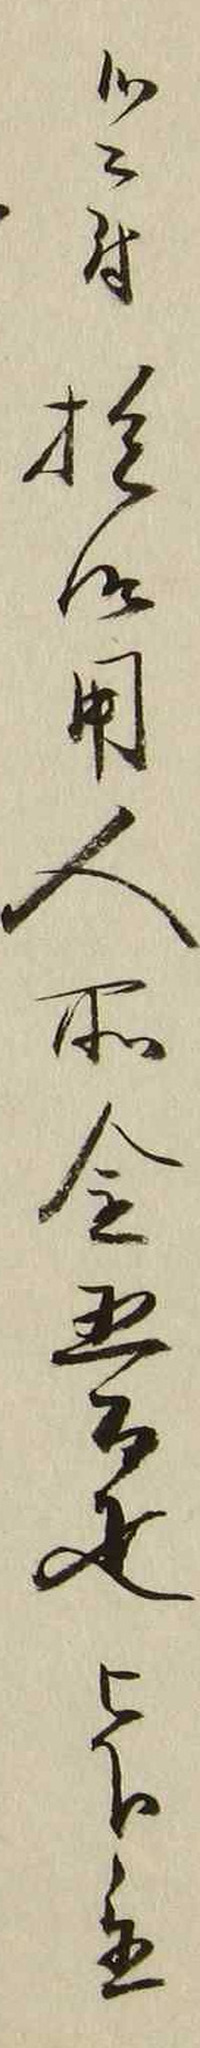候ニ付於御用人所金五百疋被下置
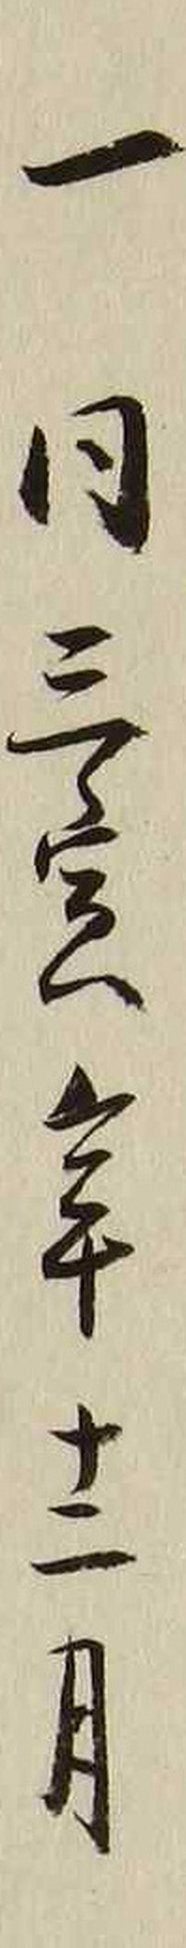一同三寅年十二月
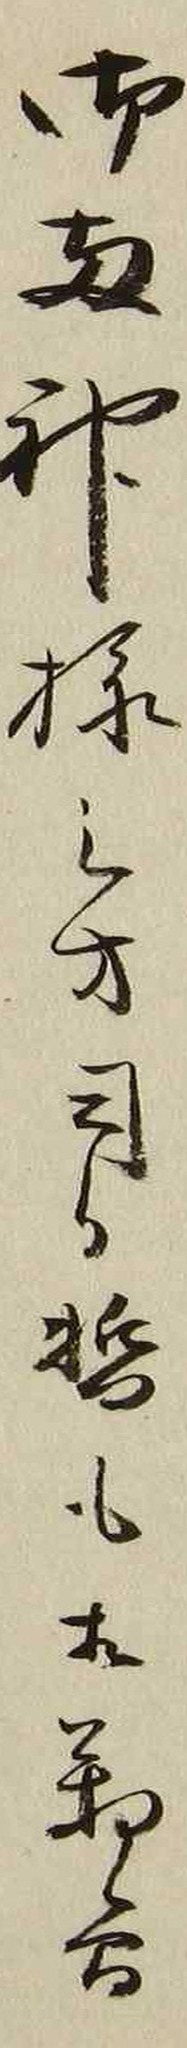御両神様之方司り暫も相勤候間
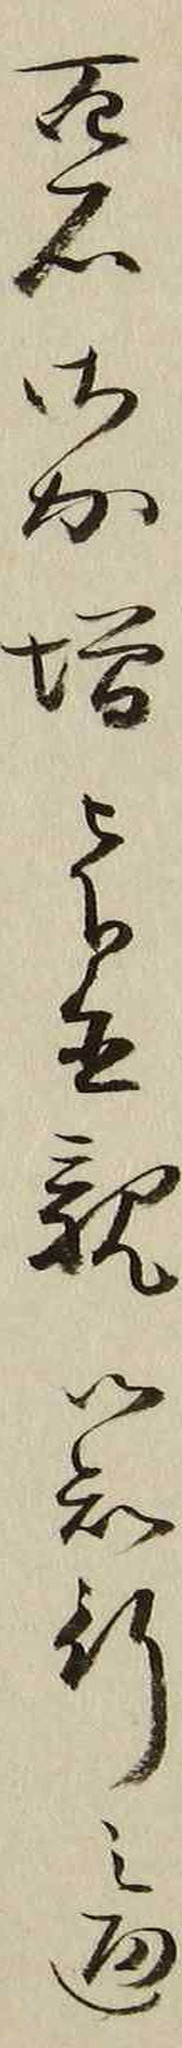百石御加増被下置親御知行之通
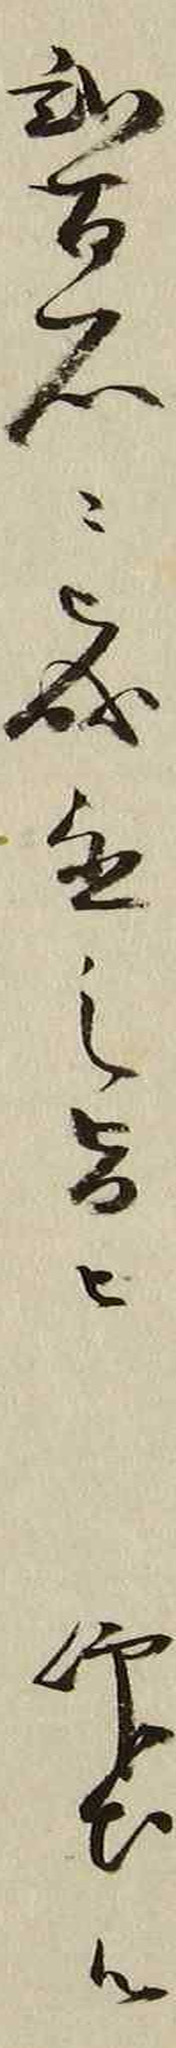弐百石ニ被成置之旨被仰出候
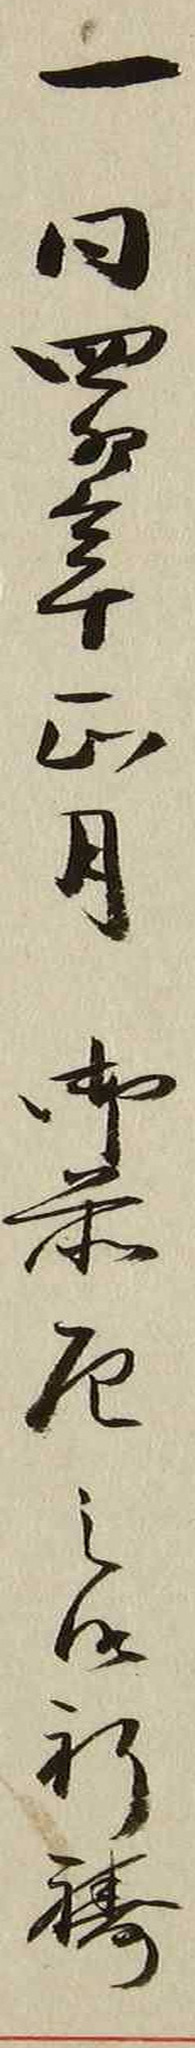一同四卯年正月御前厄之御祈祷
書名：諸士系譜　巻之291　さ之部23
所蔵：会津若松市立会津図書館
